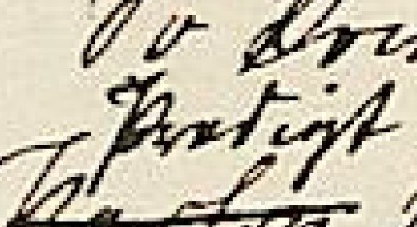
Predit
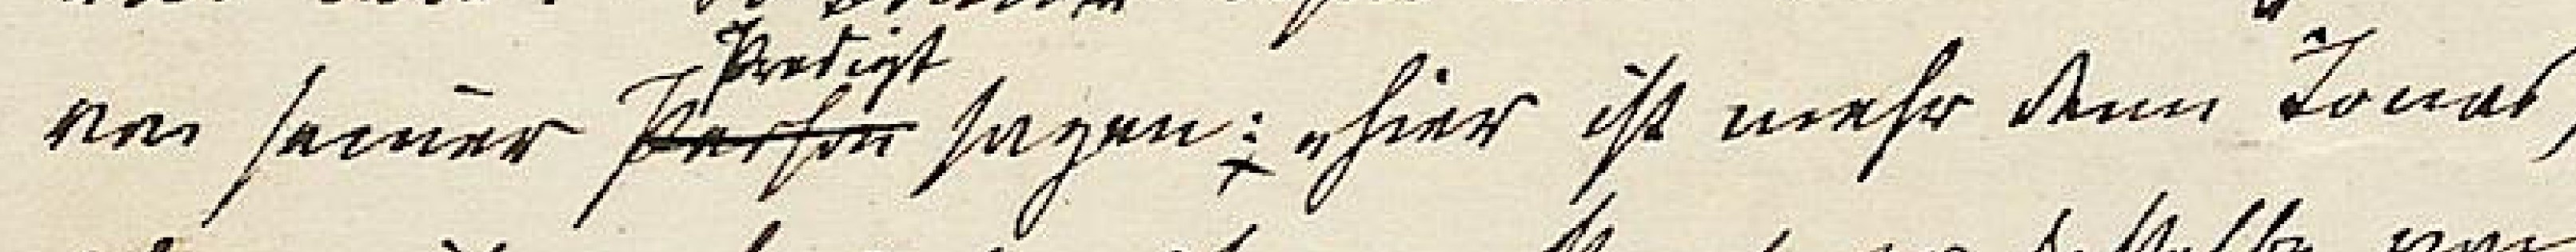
von seiner Person sagen: "Hier ist mehr denn Jonas,"
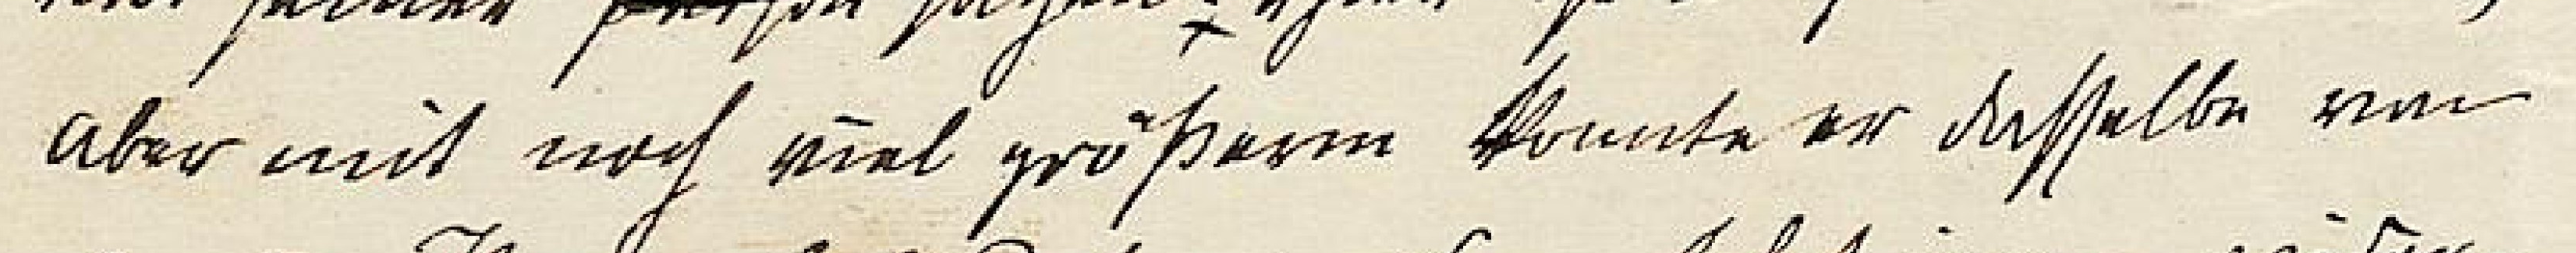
aber mit noch viel größerm konnte er dasselbe von
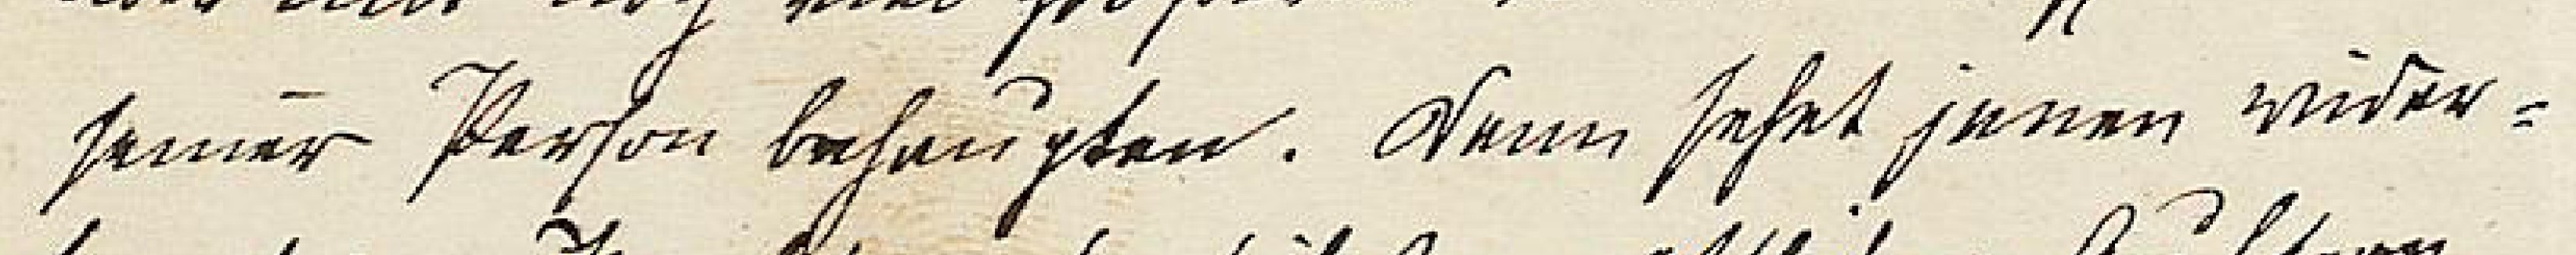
seiner Peron behaupten. Denn sehet jenen wider¬
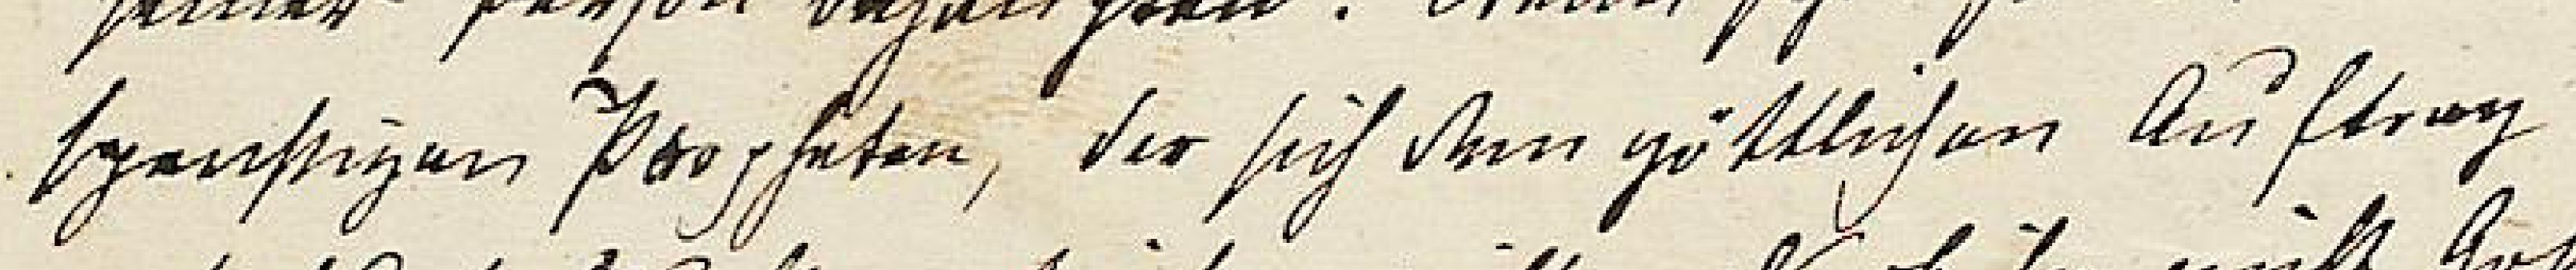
spenstigen Propheten, der sich dem göttlichen Auftrag
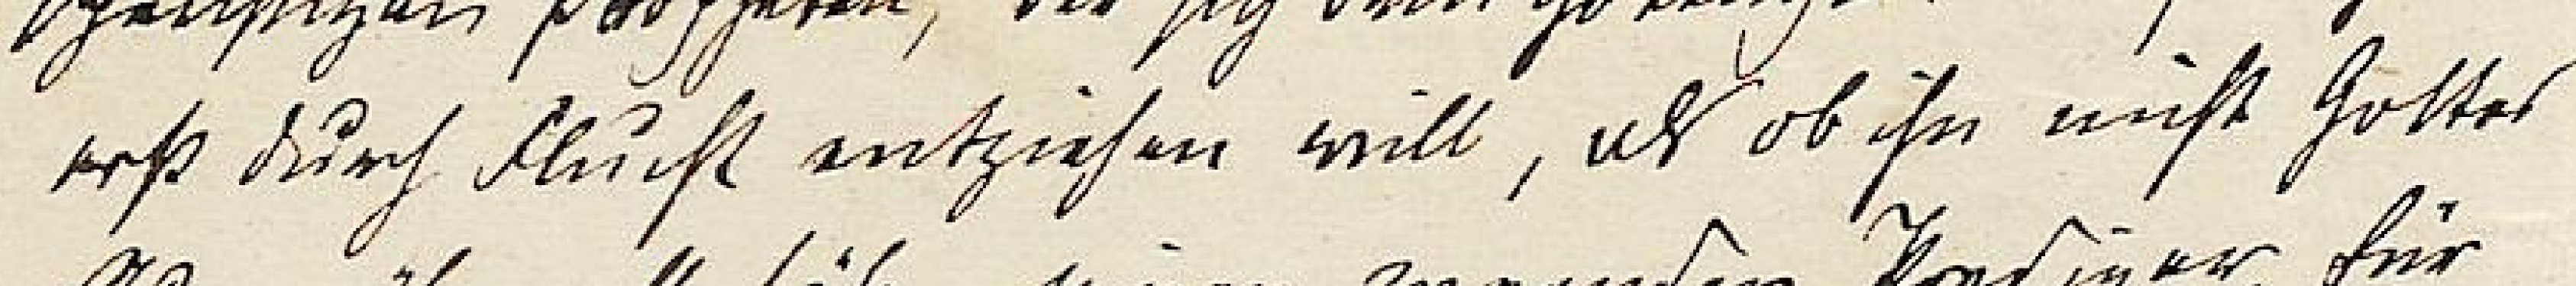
erst durch Flucht entziehen will, as ob ihn nicht Gottes
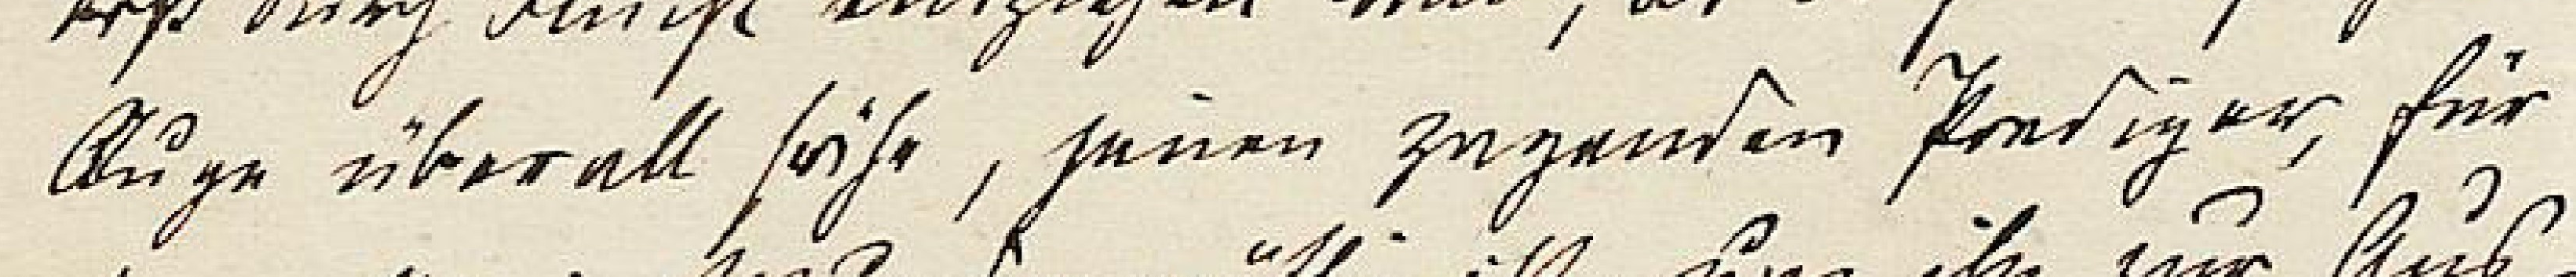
Auge überall sähe, jenen Prediger, für
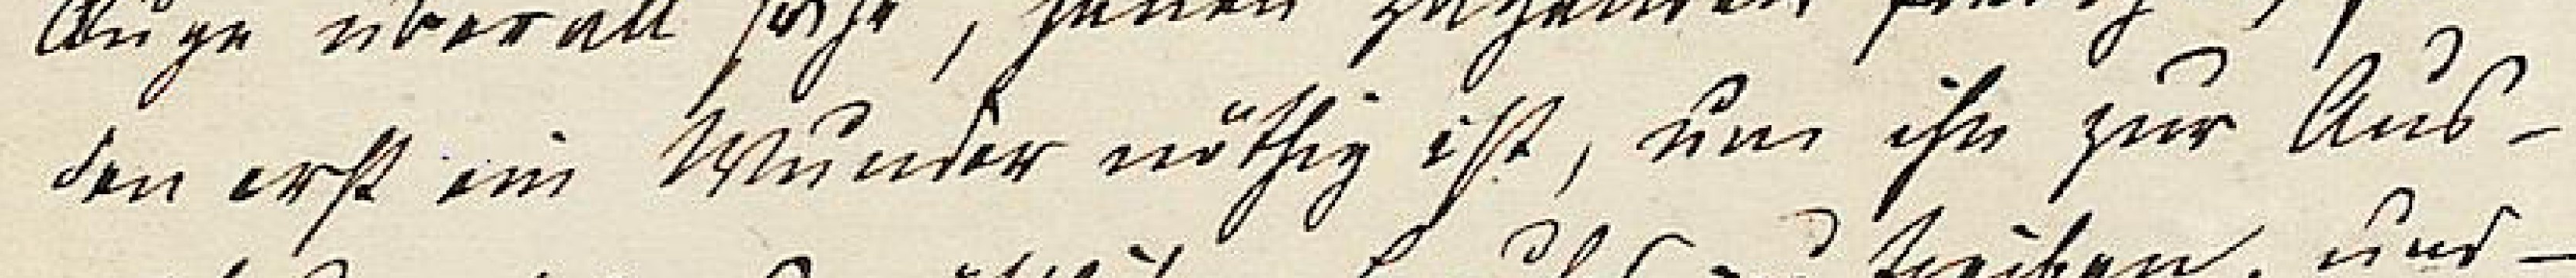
den erst ein Wunder nöthig ist, um ihn zur Aus¬
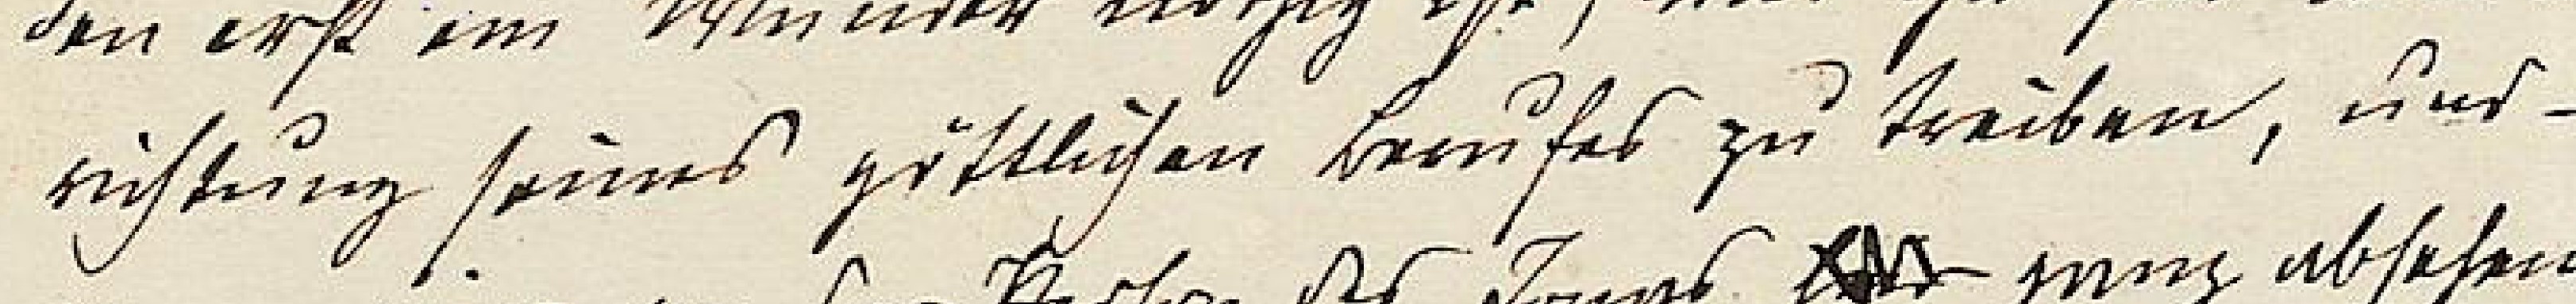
richtung seines göttlichen Berufes zu treiben, und
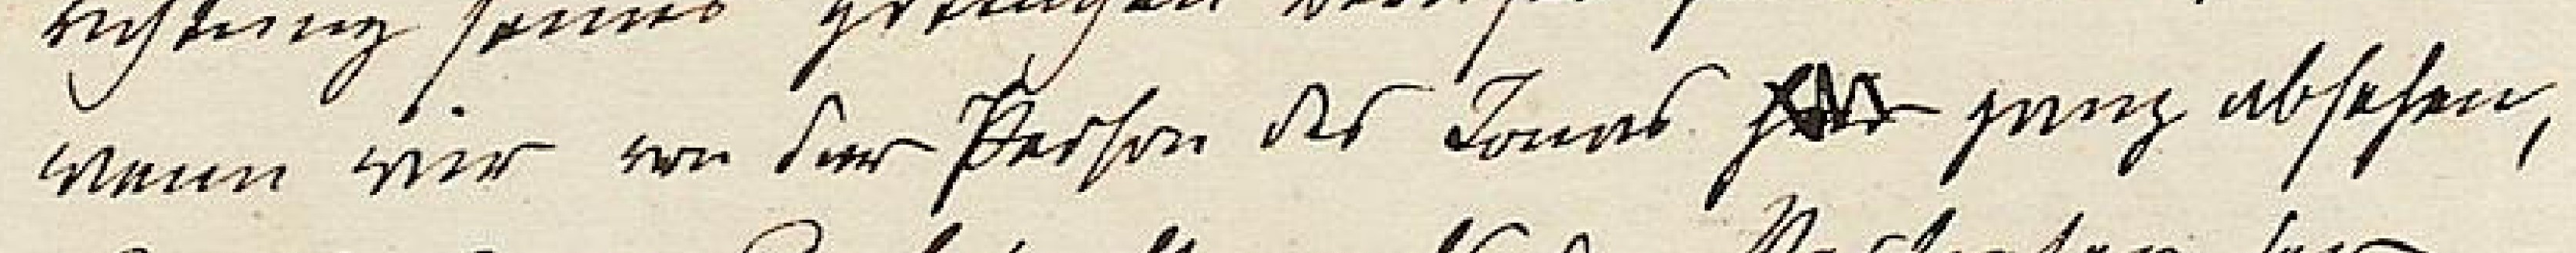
wenn wir, von dier Person des Jonas ganz absehen,
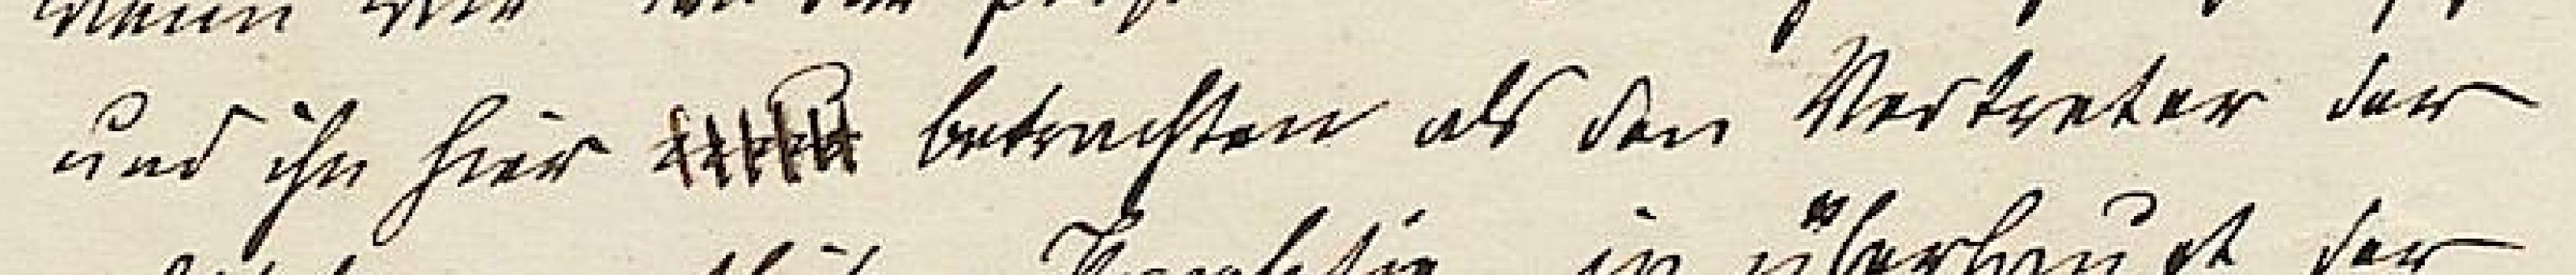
und ihn hier nur betrachten als den Vertreter der
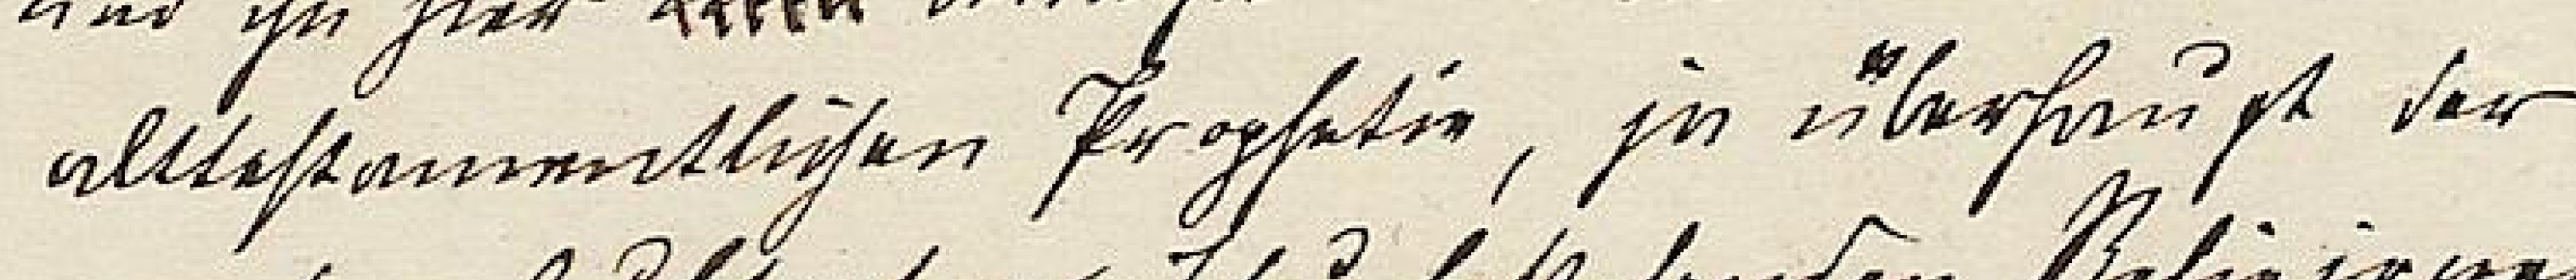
alttestamentlichen Prophetie, ja überhaupt der
